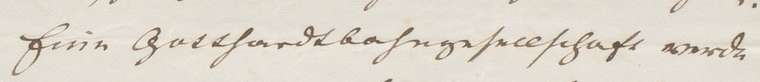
Eine Gotthardbahngesellschaft werde
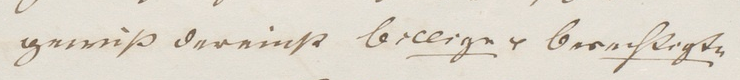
gewiß dereinst billiger & berechtigte
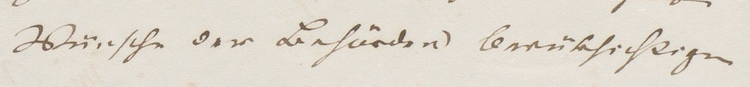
Wünsche der Behörden berüksichtigen
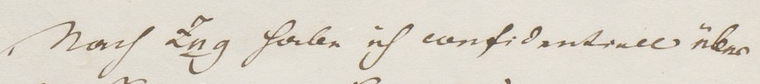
Nach Zug habe ich confidentiell über
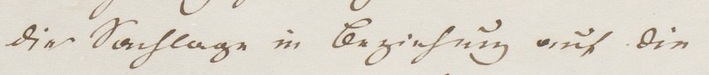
die Sachlage in Beziehung auf die
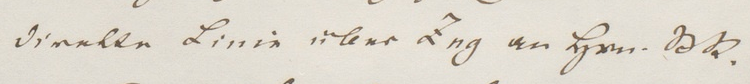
direkte Linie über Zug an Hrn. RR.
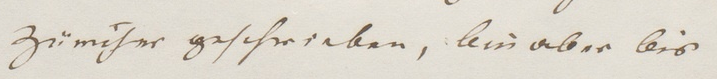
Zürcher geschrieben, bin aber bis
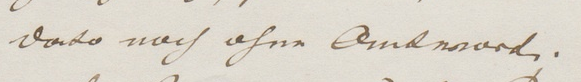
dato noch ohne Antwort. –
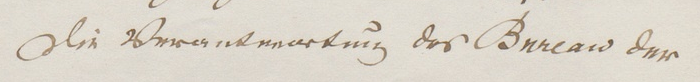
Die Verantwortung des Bureau der
